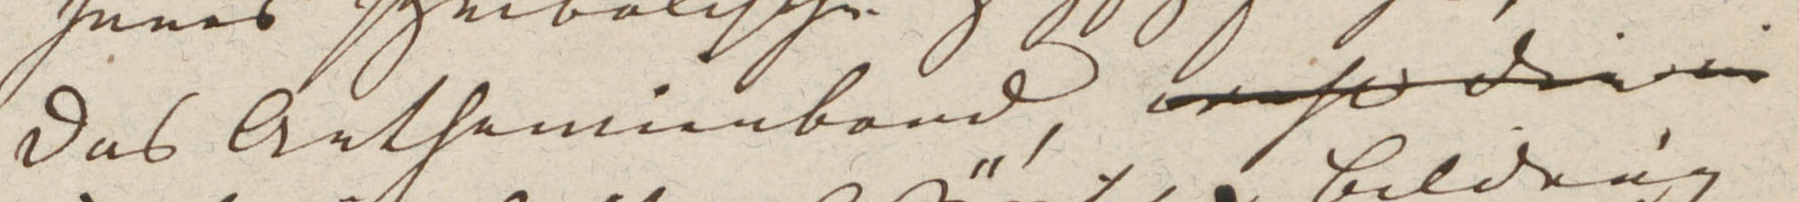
das Anthemienband, wohl die in
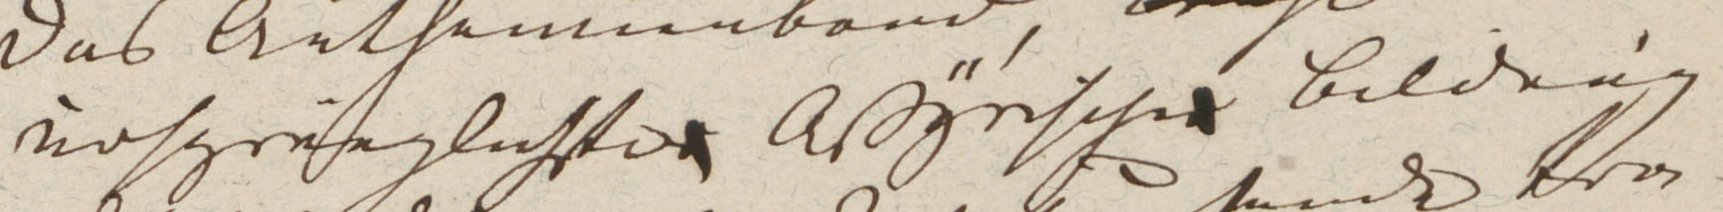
ursprünglichster Assyrischer Bildung
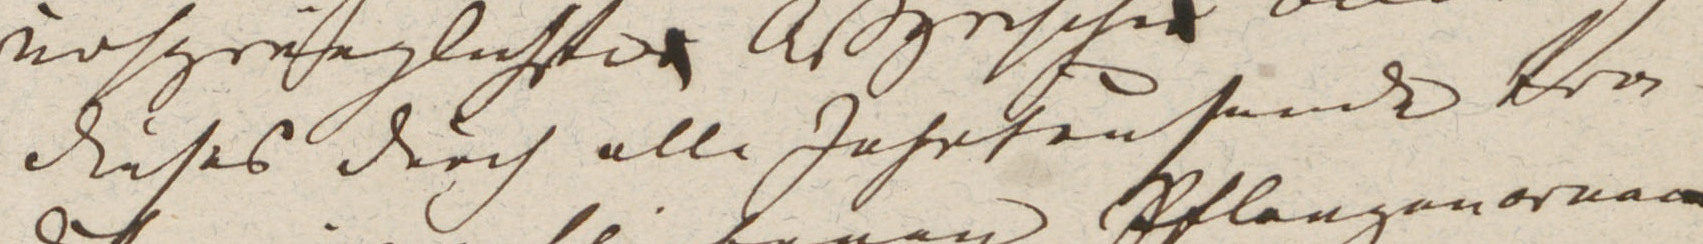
dieses durch alle Jahrhtausende tra-
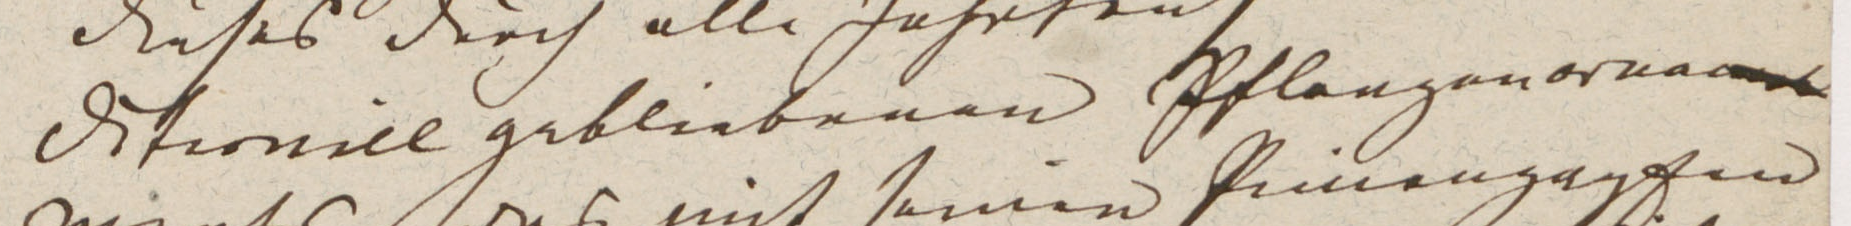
ditionell gebliebenen Pflanzenornam
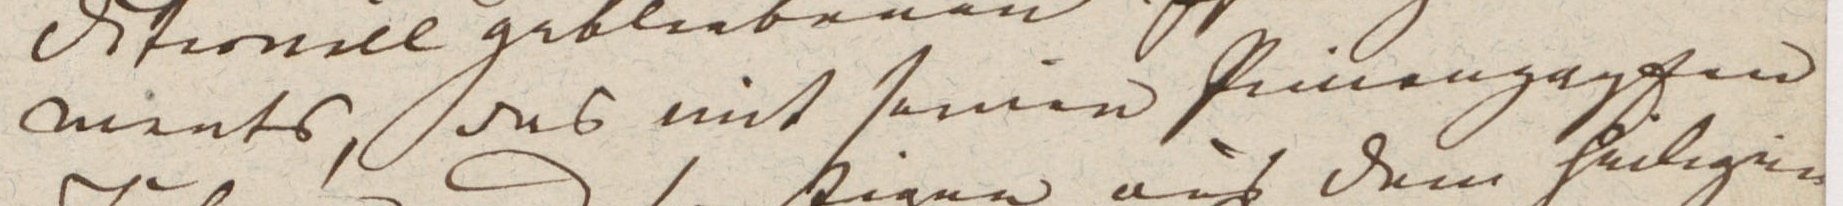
ments, das mit seinen Pinienzapfen
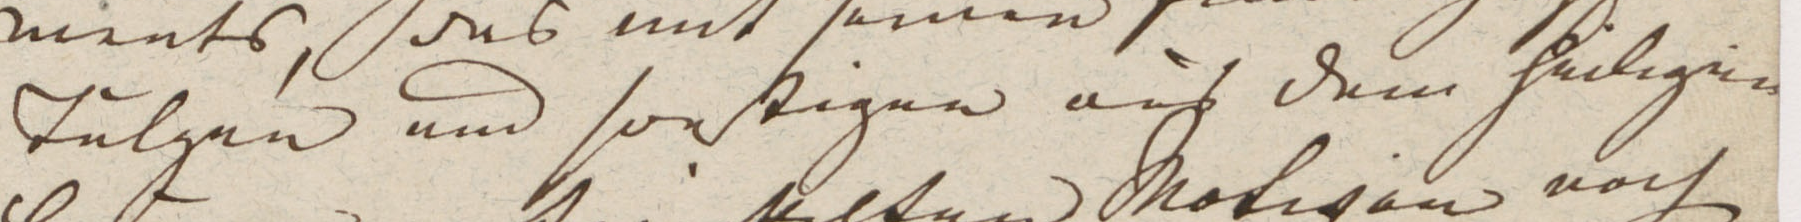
Tulpen und sonstigen aus dem heiligen
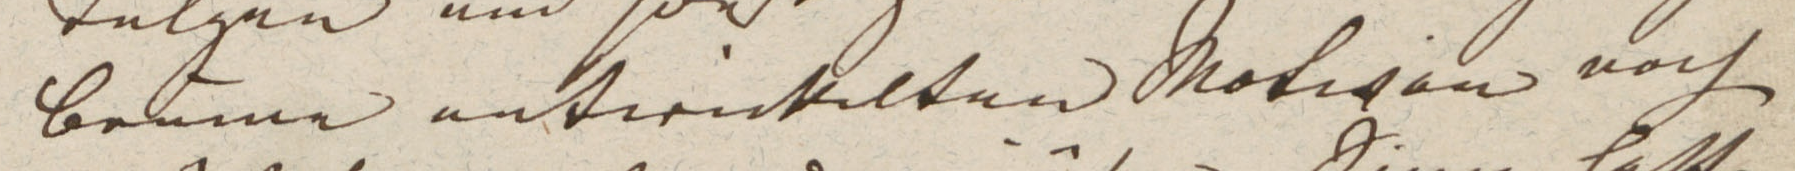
Baume entwickelten Motiven noch
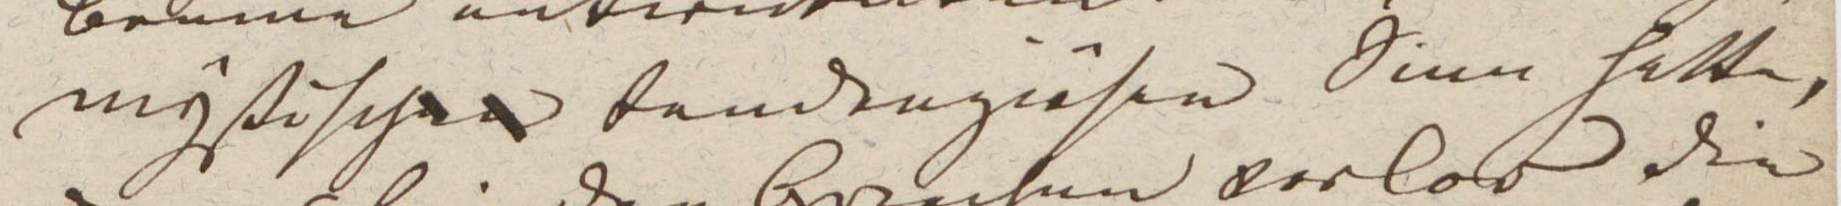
mystischen tendenziösen Sinn hatte,
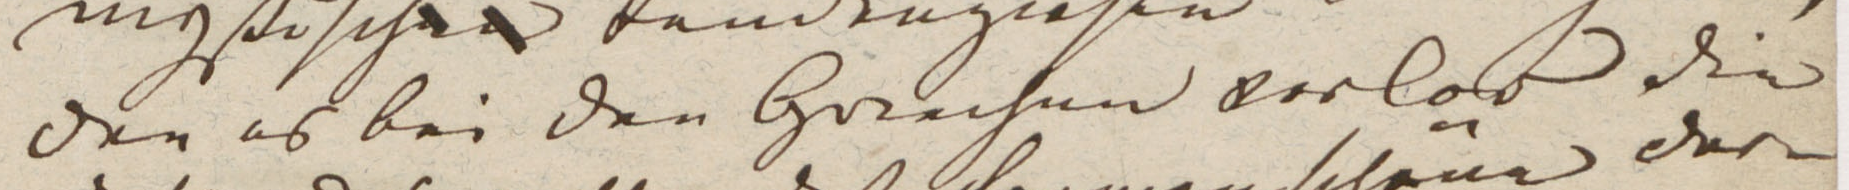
den es bei den Griechen verlor die
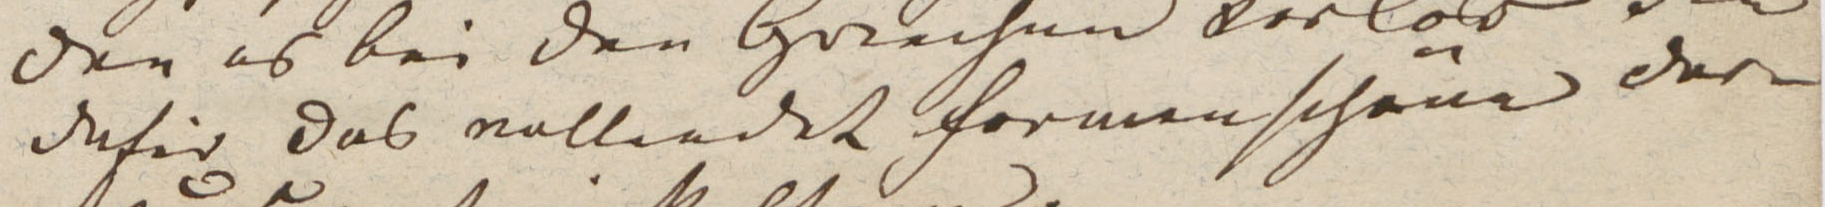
dafür das vollendet Formenschöne dar-
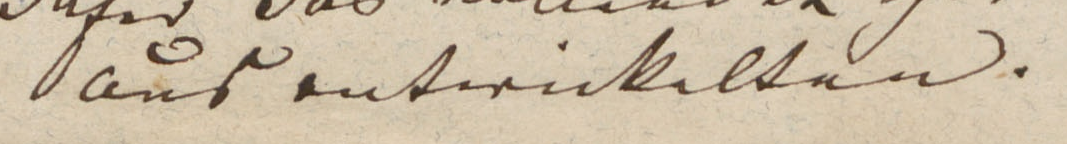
aus entwickelten.
